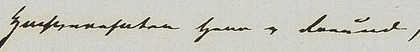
Hochverehrter Herr & Freund,
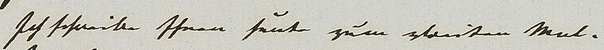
Ich schreibe Ihnen heute zum zweiten Mal.
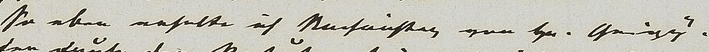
So eben erhalte ich Nachrichten von Hrn. Geigy.
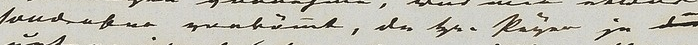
sonderbar vorkömmt, da Hr. Peyer ja dasein
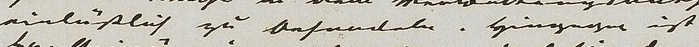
einläßlich zu behandeln. Hingegen ist
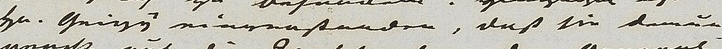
Hr. Geigy einverstanden, daß sie demun-
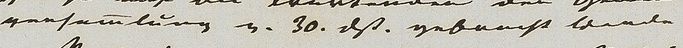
versammlung v. 30. dß. gebracht werde. –
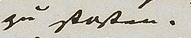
zu stoßen.
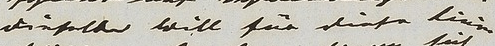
Dieselbe will für diese Linie
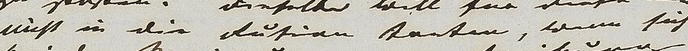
nicht in die Fusion treten, wenn sich
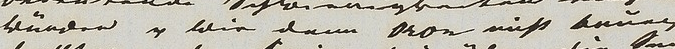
würden & wir dann Oron nicht bauen
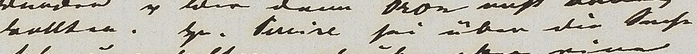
wollten. Hr. Pereire sei über die Sache
